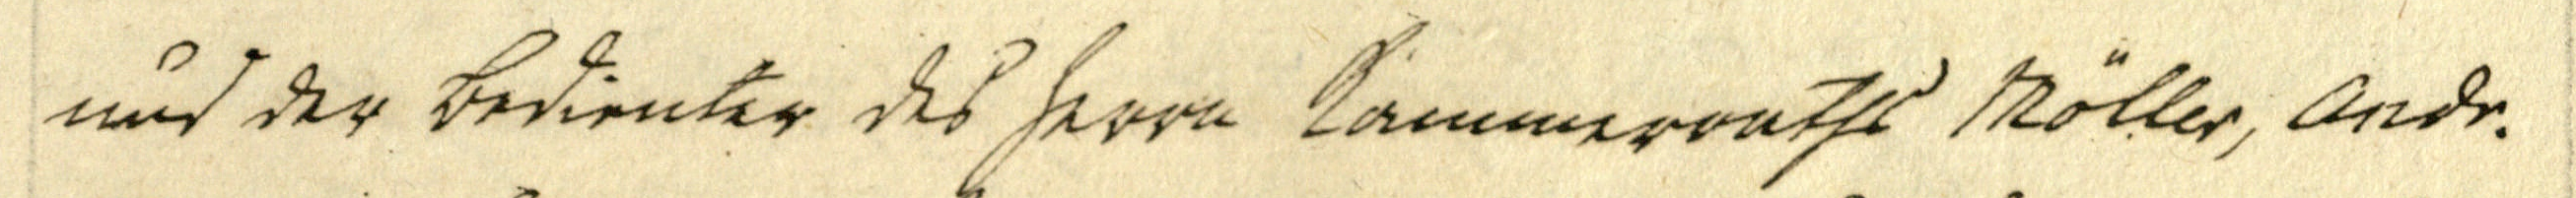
und der Bedienter des herrn Kammerraths Möller, Andr.
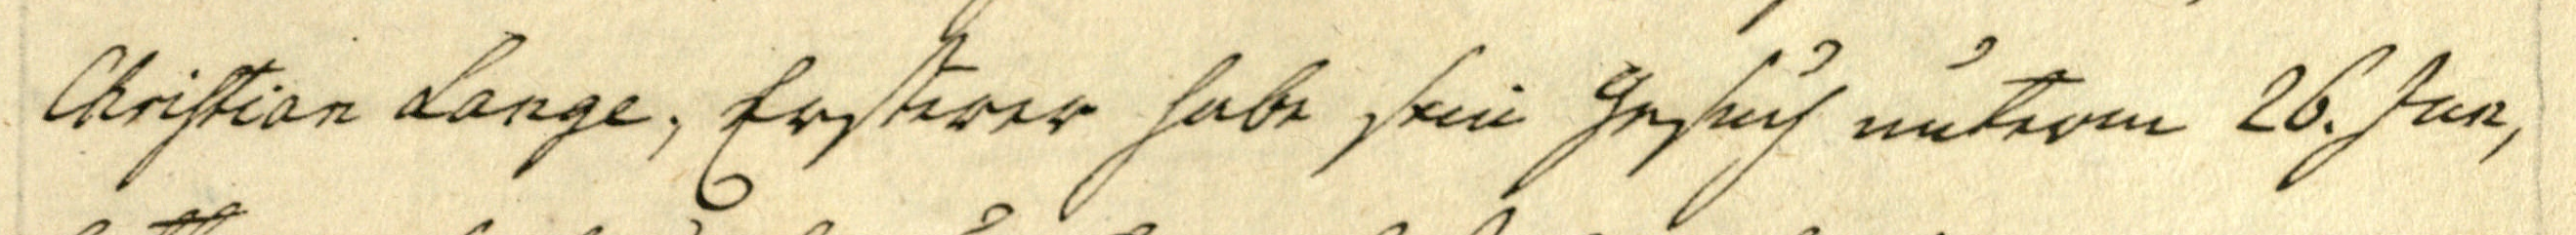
Christian Lange, Ersterer habe sein Gesuch unterm 26. Jun.,
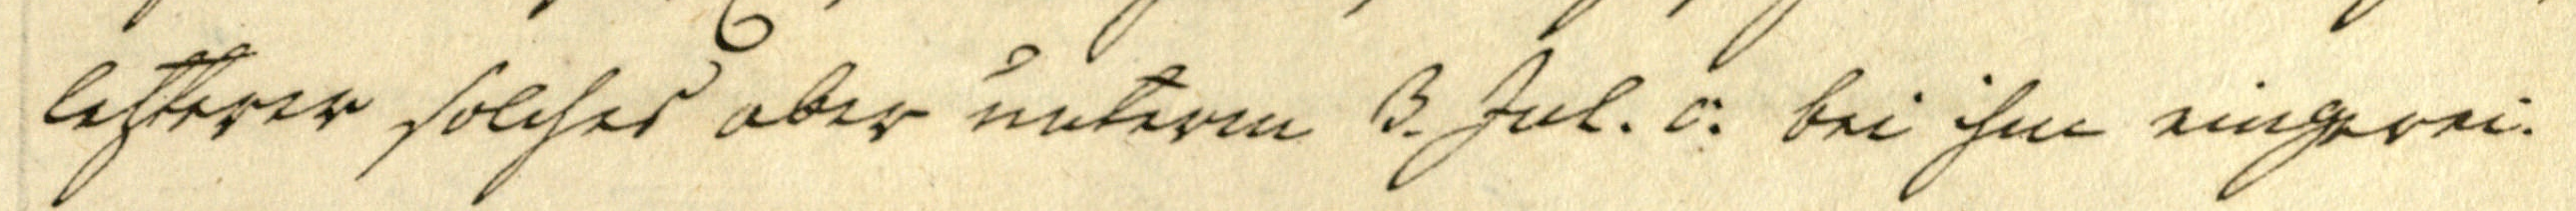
letzterer solches aber unterm 3. Jul. c. bei ihm eingerei¬
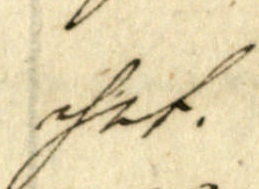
chet.
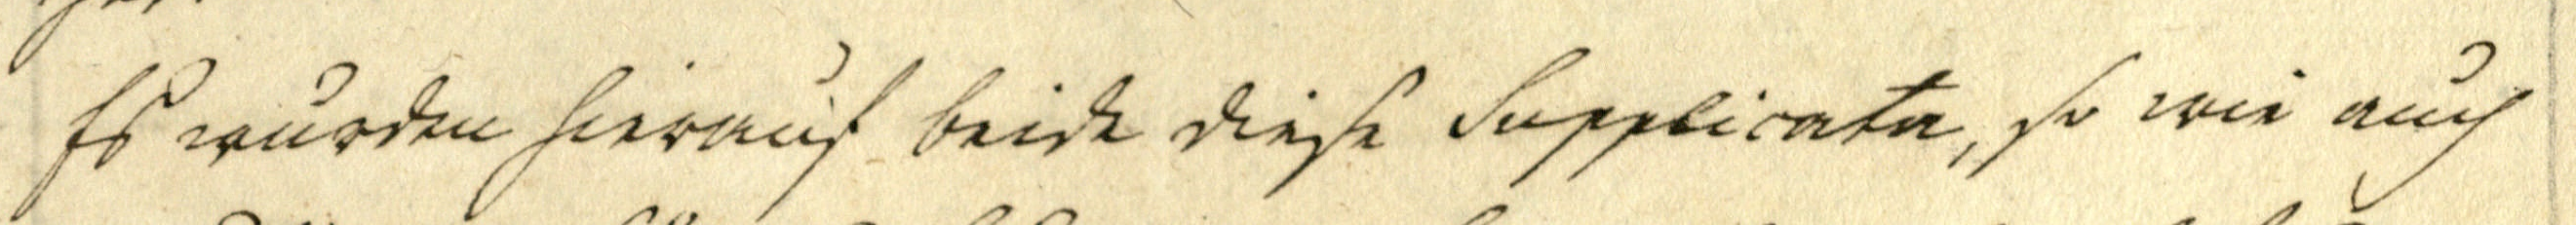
Es wurden hierauf beide diese Supplicata, so wie auch
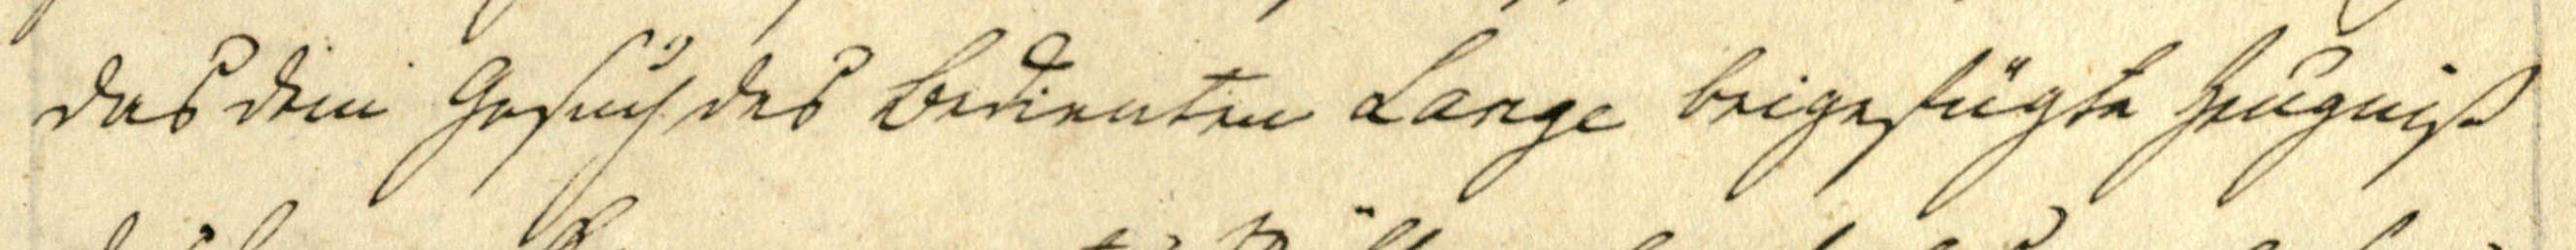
das dem Gesuch des Bedienten Lange beigefügte Zeugniß
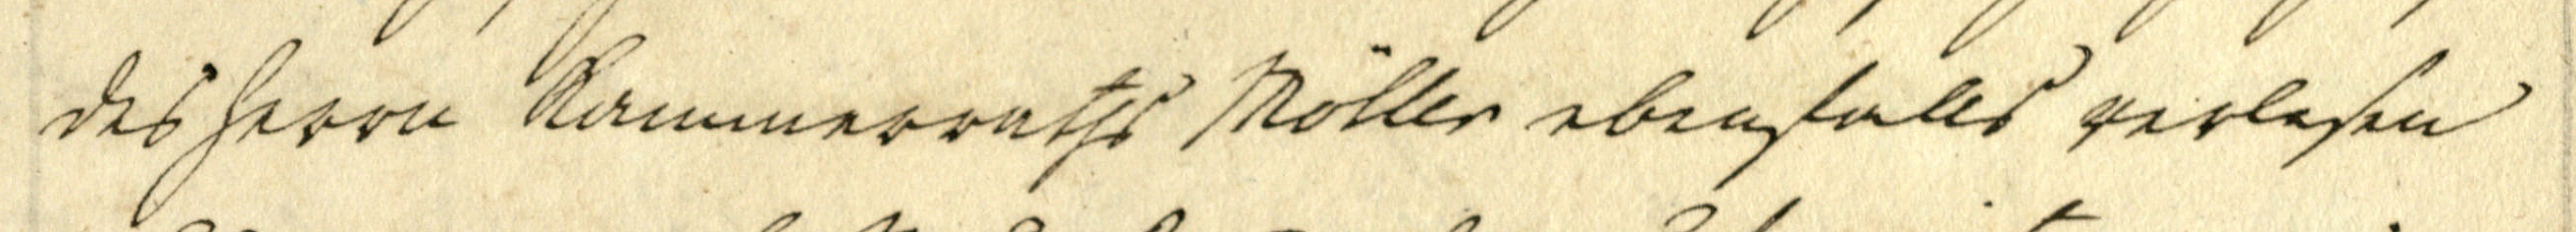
des herrn Kammerraths Möller ebenfalls verlesen
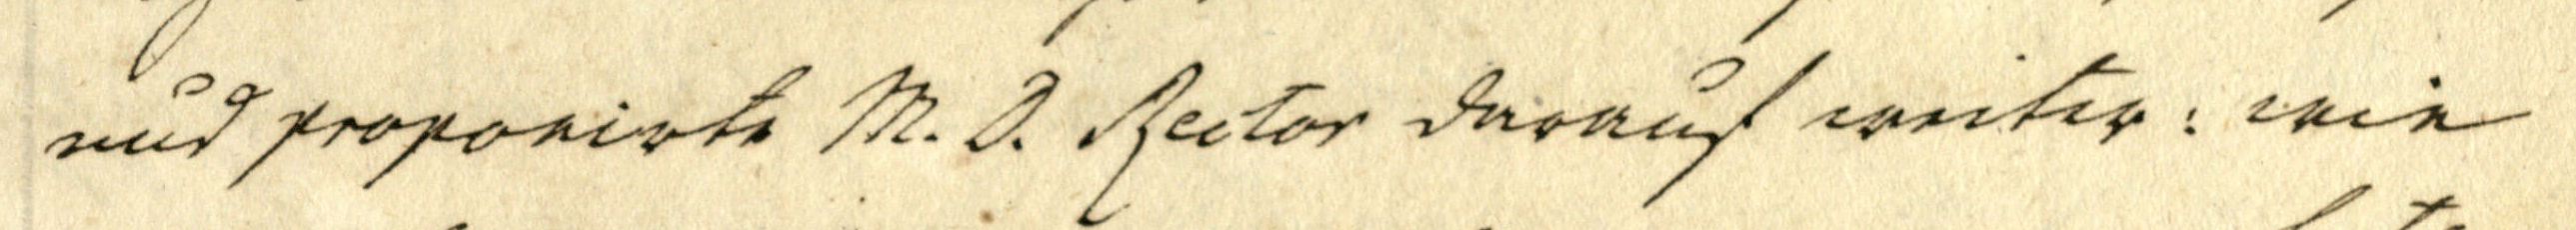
und proponirte M. D. Rector darauf weiter: wie
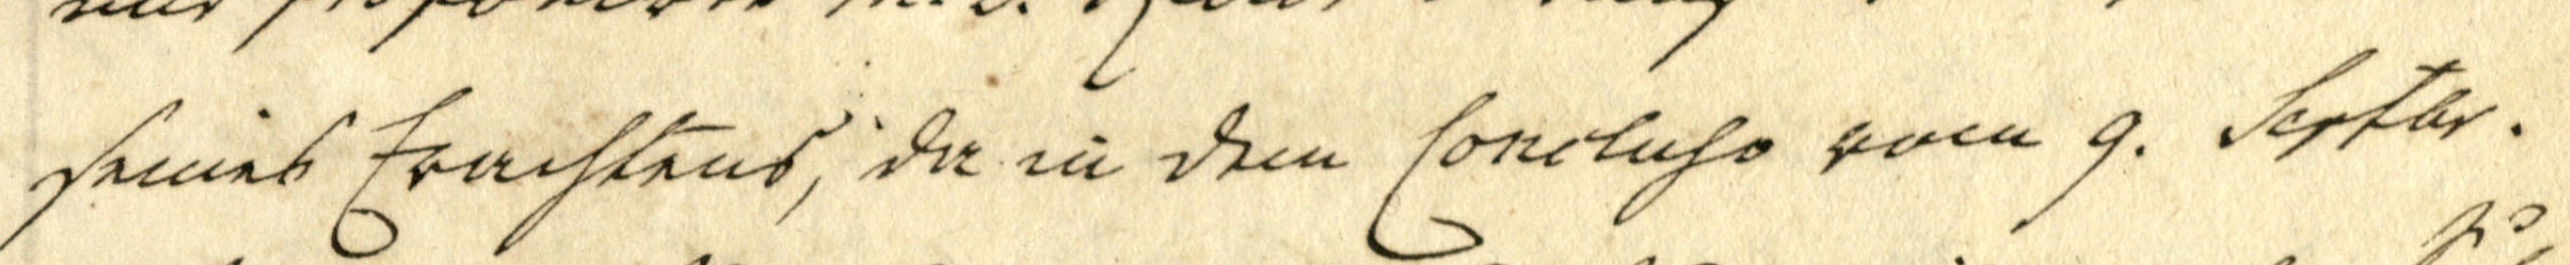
seines Erachtens, da in dem Concluso vom 9. Septbr.
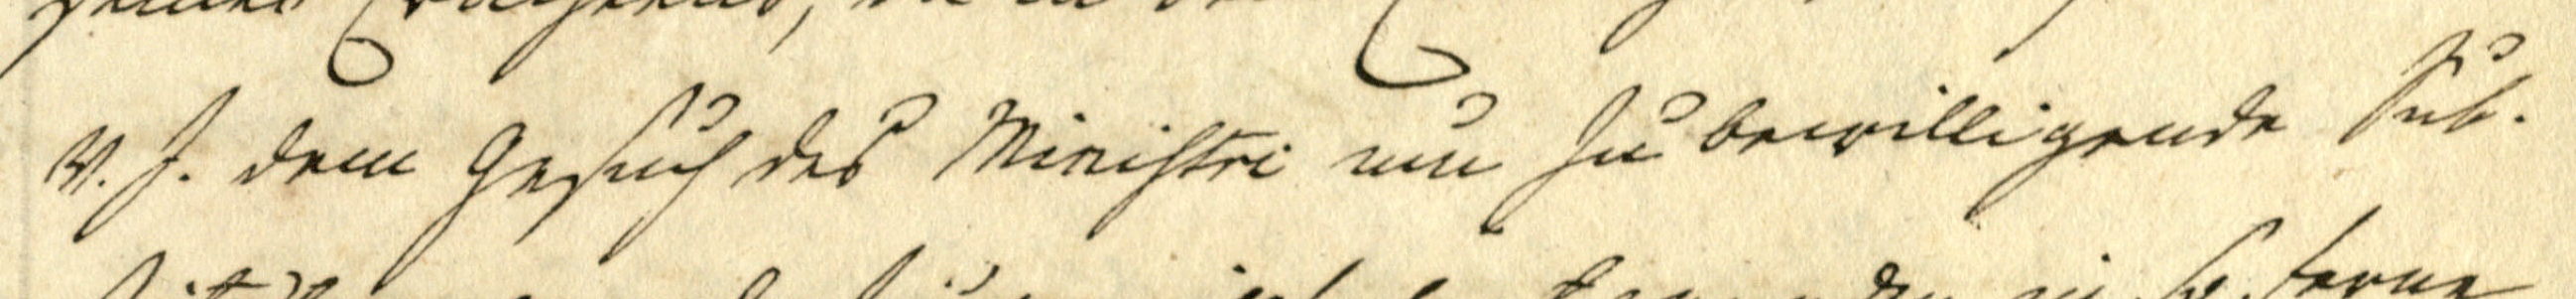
v. J. dem Gesuch des Ministri um zu bewilligende Sub¬
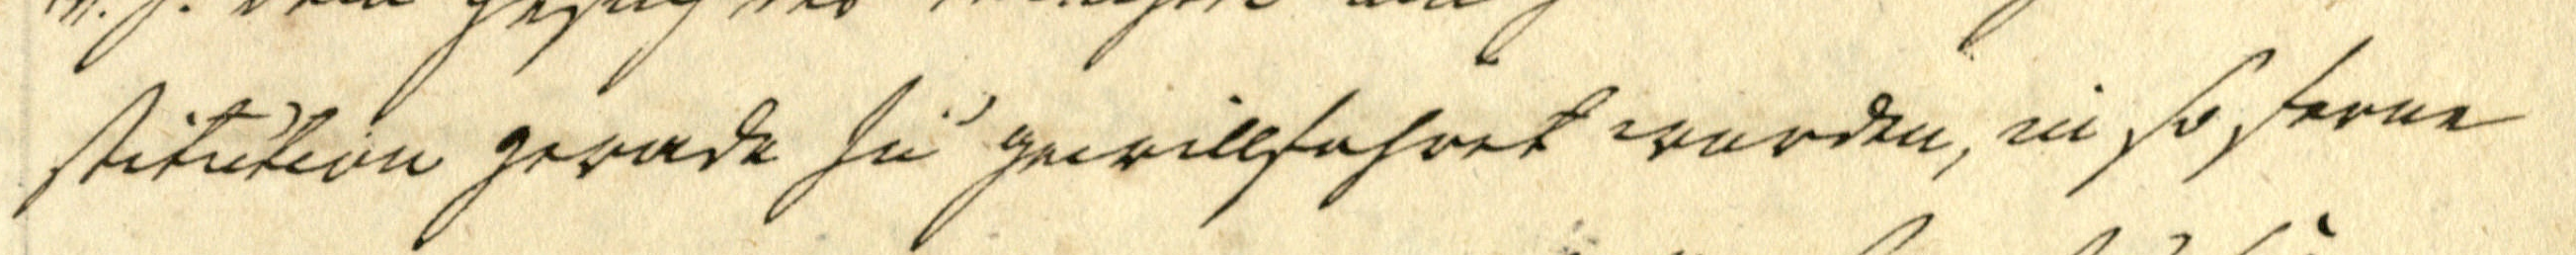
stitution gerade zu gewillfahret wurden, in so ferne
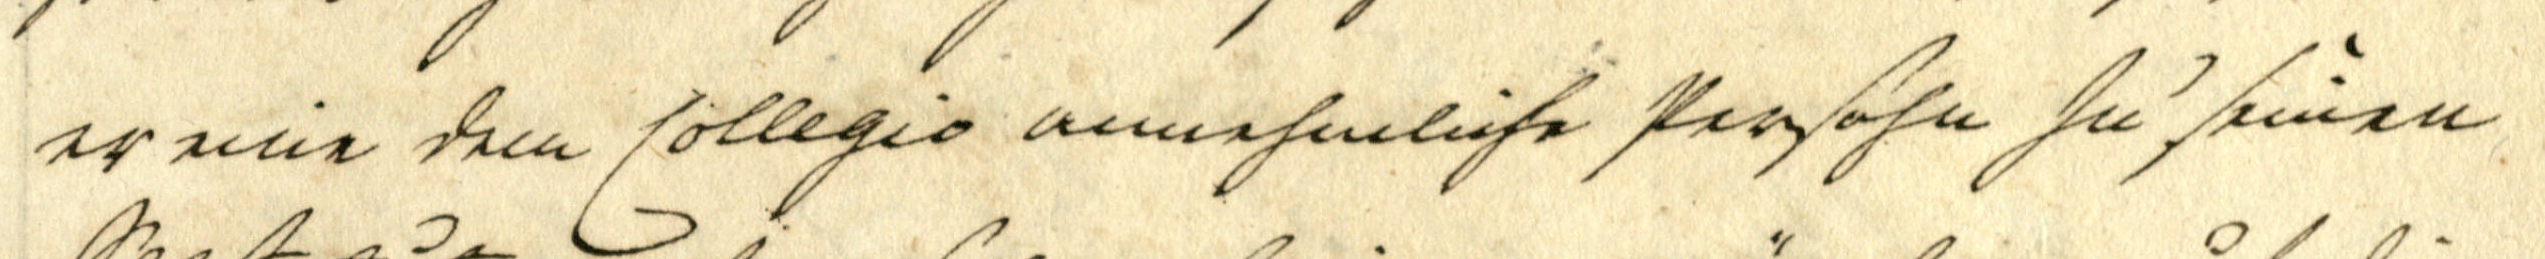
er eine dem Collegio annehmliche Persohn zu seinen
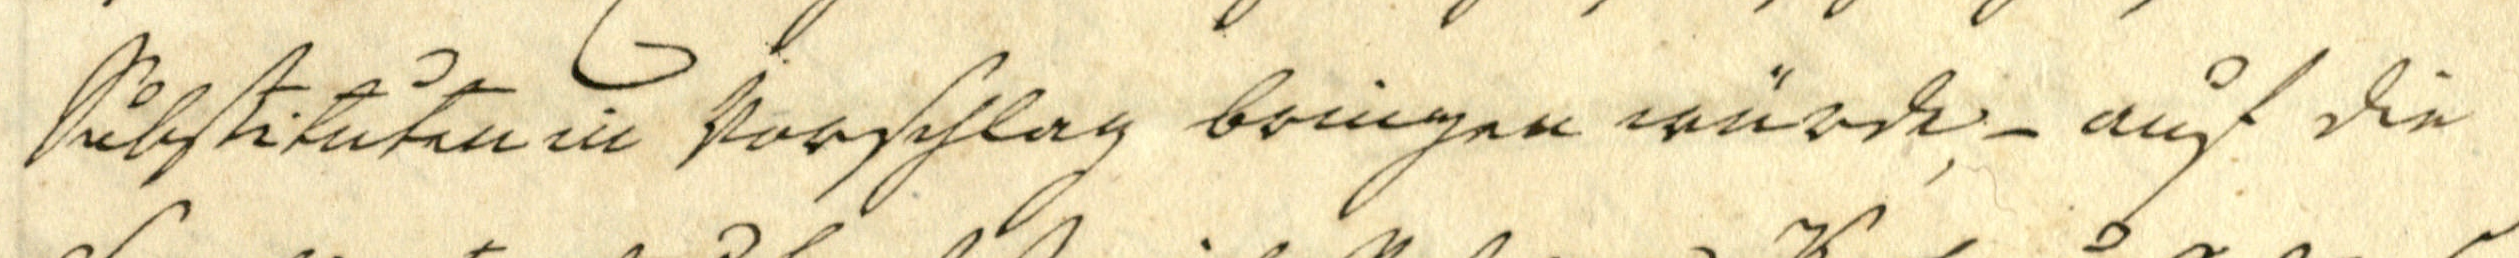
Substituten in Vorschlag bringen würden, auf die
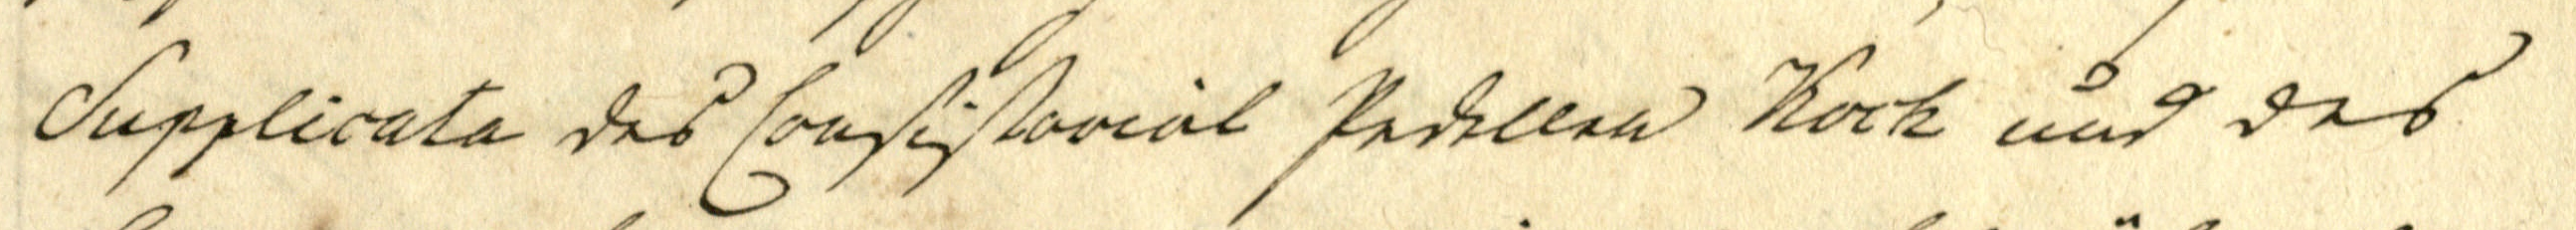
Supplicata des Consistorial Pedellen Koch und des
